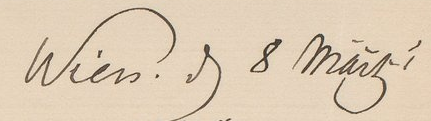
Wien. den 8 März
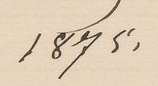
1875.
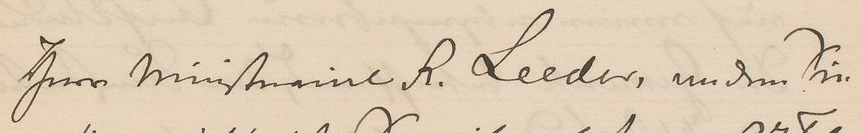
Herr MinisterialR. Leeder, von dem Sie
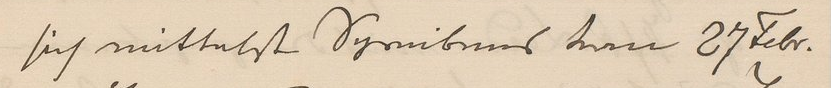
sich mittelst Schreibens vom 27. Febr.
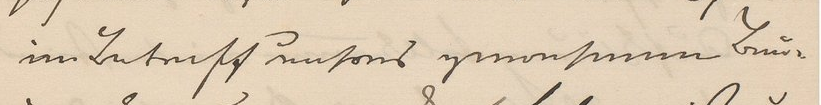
im Betreff unsres gemeinsamen Bau-
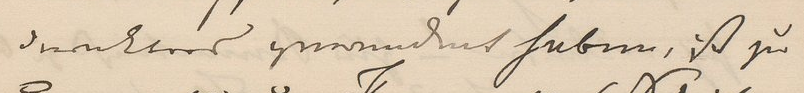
directors gewendet haben, ist zu
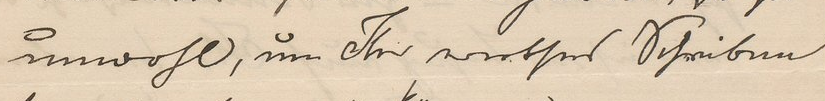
unwohl, um Ihr werthes Schreiben
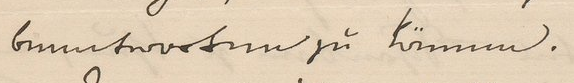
beantworten zu können
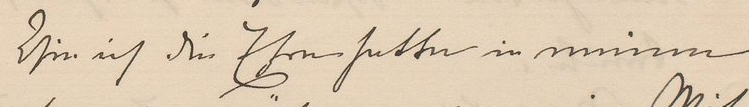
Wie ich die Ehre hatte in meinem
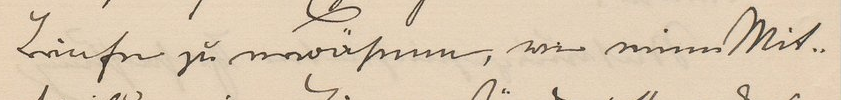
Briefe zu erwähnen, wie meine Mit-
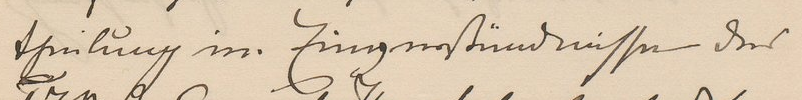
theilung im Eingeständnisse des
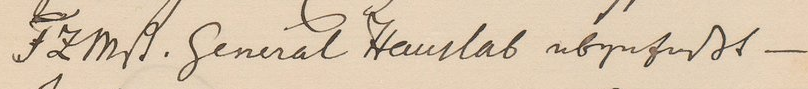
FZMst. General Hauslab abgefaßt –
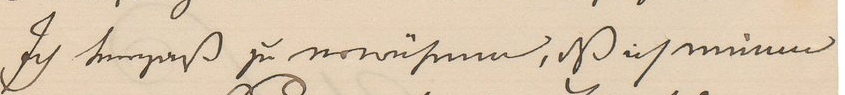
Ich vergaß zu erwähnen, daß ich meinen
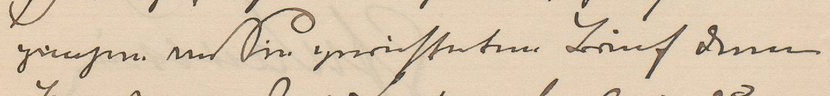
ganzen an Sie gerichteten Brief dem
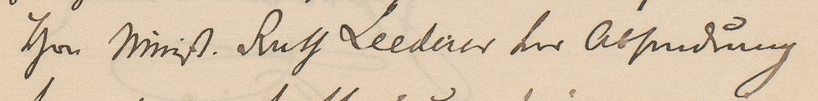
Hrn Minist.Rath Leeder vor Absendung
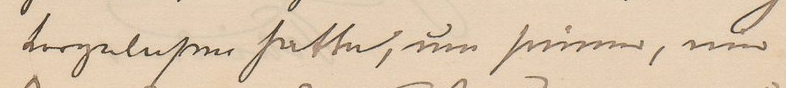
vorgelesen hatte, um seiner, mir
